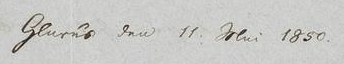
Glarus den 11. Mai 1850.
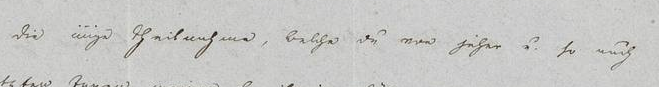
Die innige Theilnahme, welche Du von jeher u. so auch
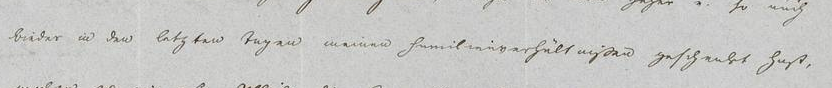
wieder in den letzten Tagen meinen Familienverhältnissen geschenkt hast,
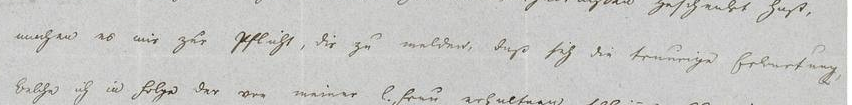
machen es mir zur Pflicht, Dir zu melden, daß sich die traurige Erwartung,
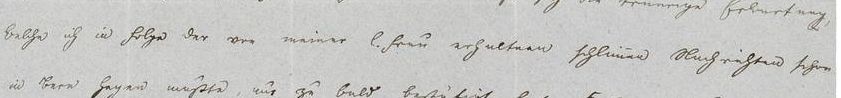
welche ich in Folge der von meiner l. Frau erhaltnen schlimmen Nachrichten schon
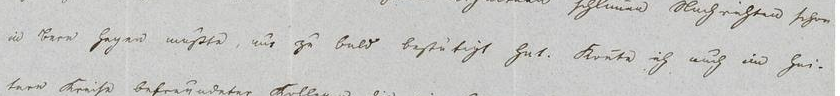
in Bern hegen mußte, nur zu bald bestätigt hat. Konnte ich auch im hei-
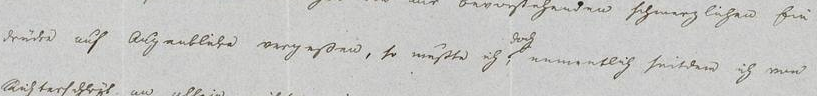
drücke auf Augenblicke vergessen, so mußte ich doch, namentlich seitdem ich von
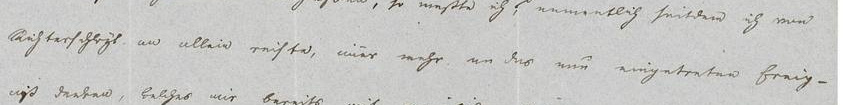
Richterschwyl an allein reiste, immer mehr an das nun eingetretne Ereig-
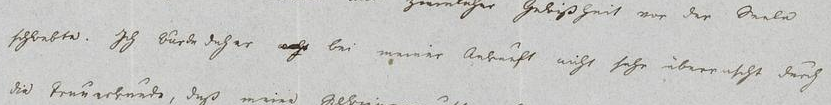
schwebte. Ich wurde daher nach bei meiner Ankunft nicht sehr überrascht durch
